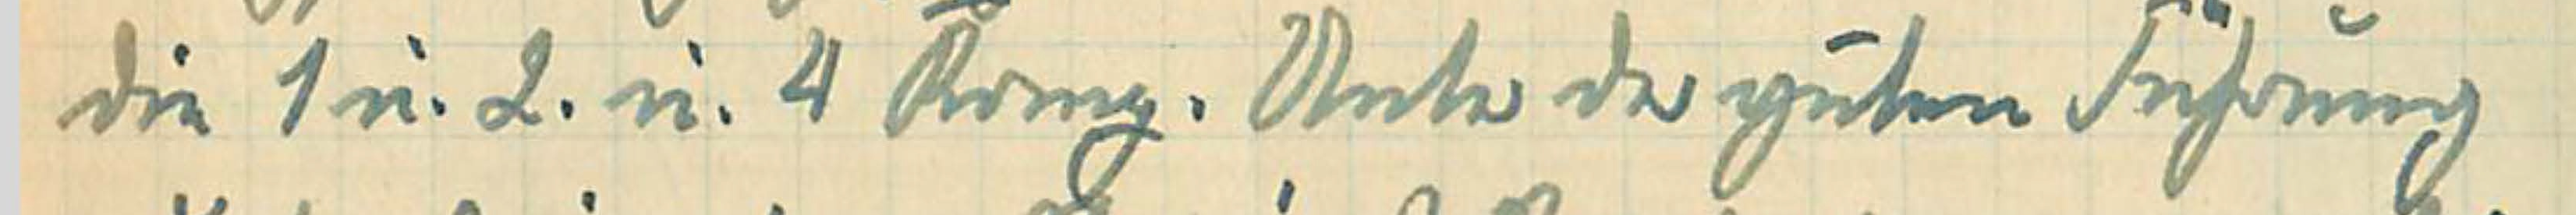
die 1. u. 2. u. 4 Komp. Unter der guten Führung
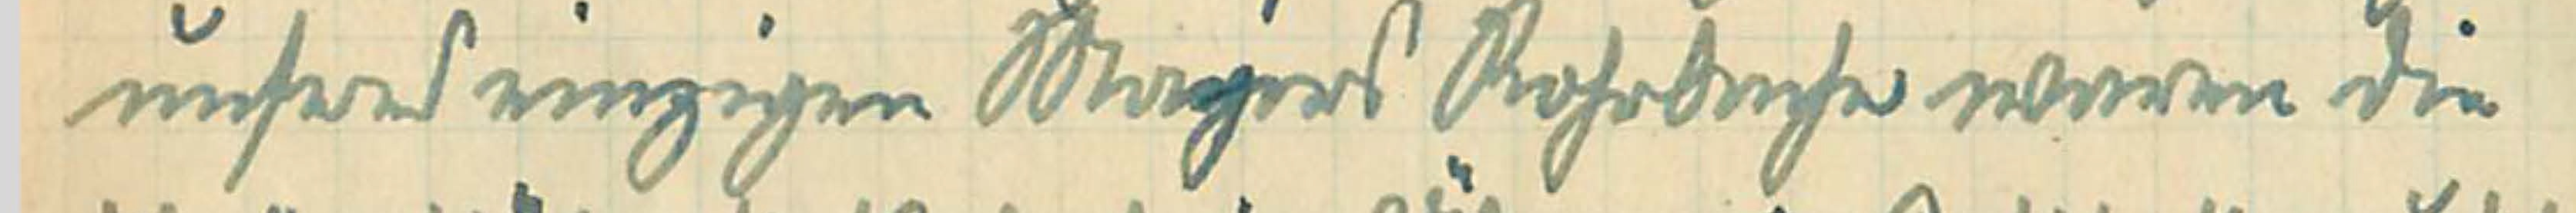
unseres einzigen Majors Rohrbacher waren die
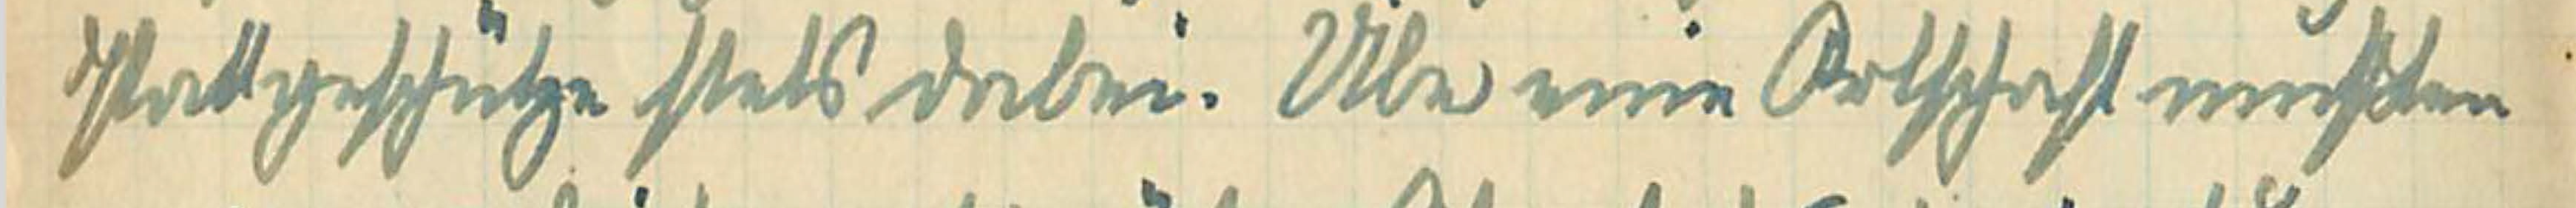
Pakgeschütze stets dabei. Über eine Ortschaft mußten
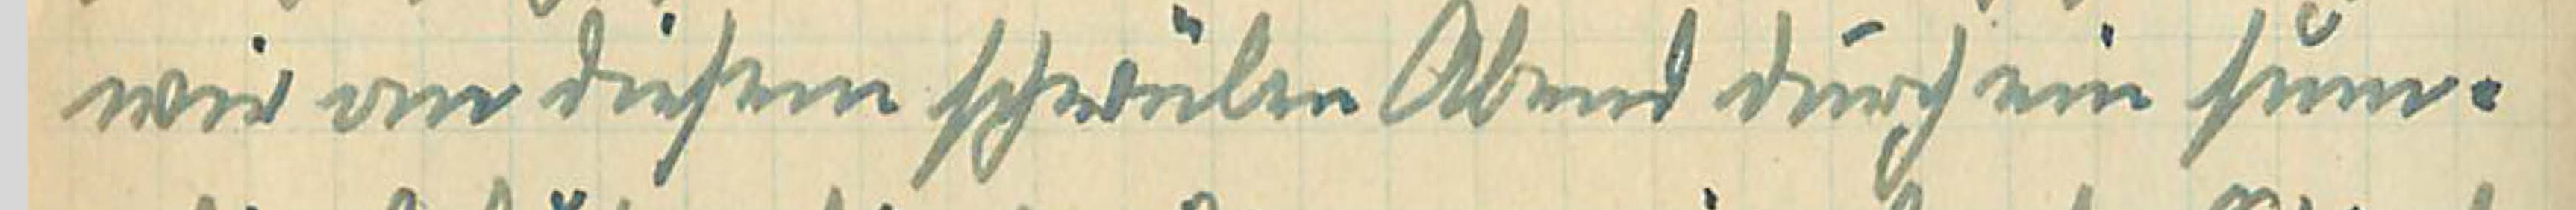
wir an diesem schwülen Abend durch ein sum-
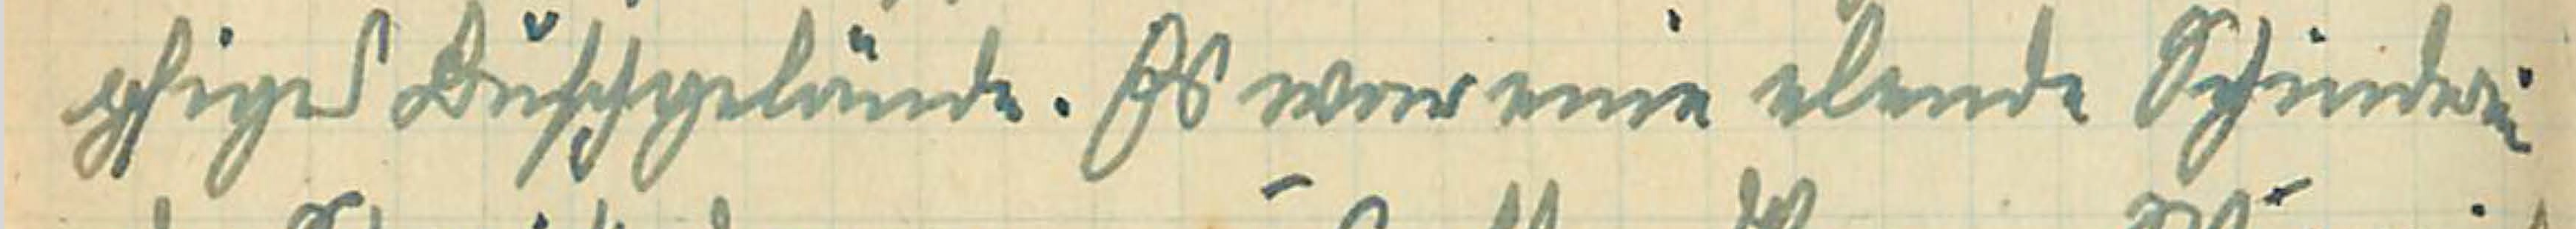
pfiges Buschgelände. Es war eine elende Schinderei.
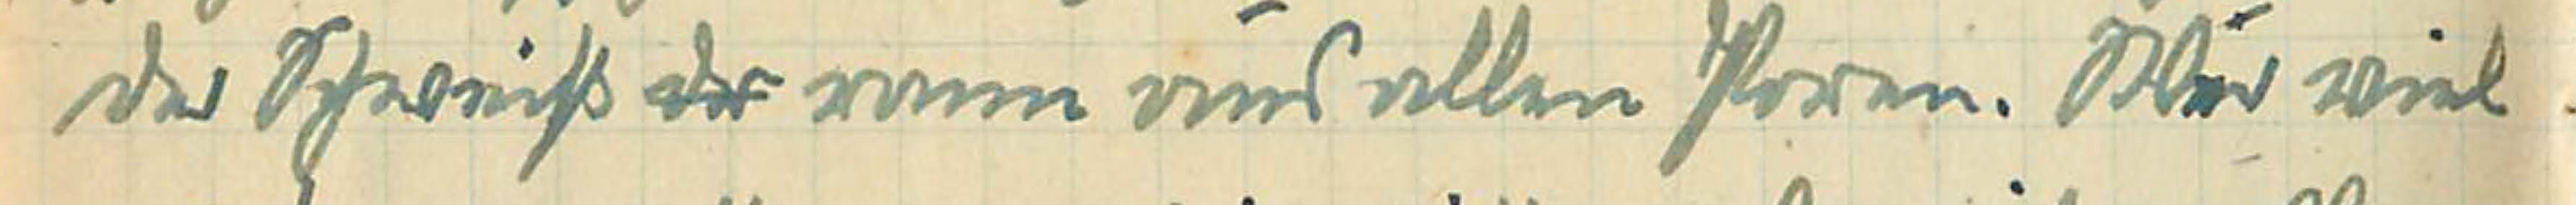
Der Schweiß dr rann aus allen Poren. Wer viel
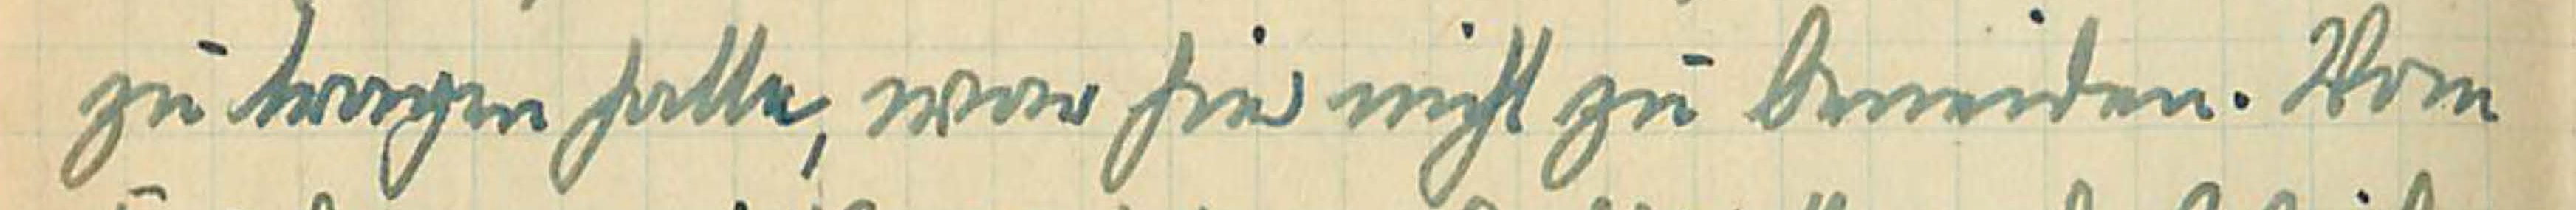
zu tragen hatte, war hier nicht zu beneiden. Vom
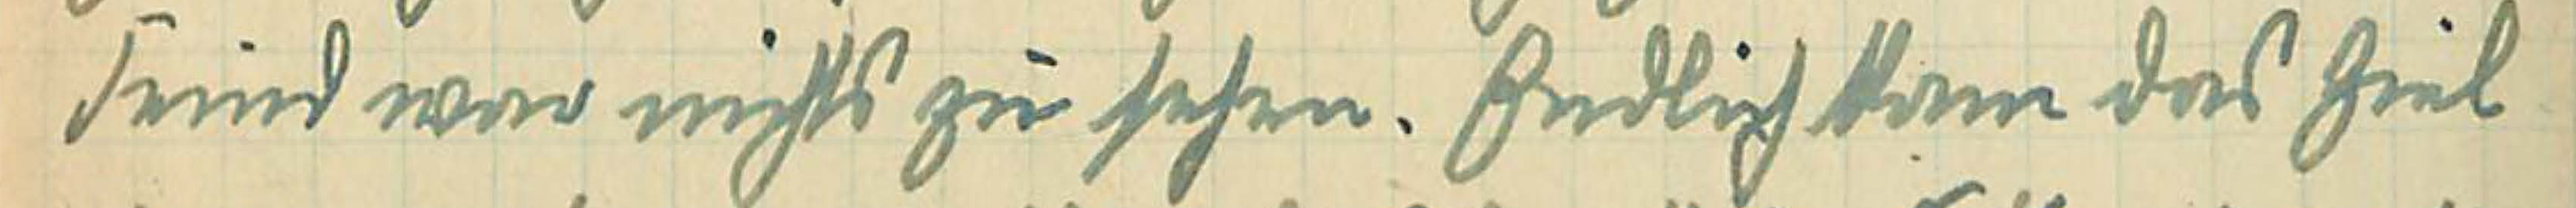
Feind war nichts zu sehen. Endlich kam das Ziel
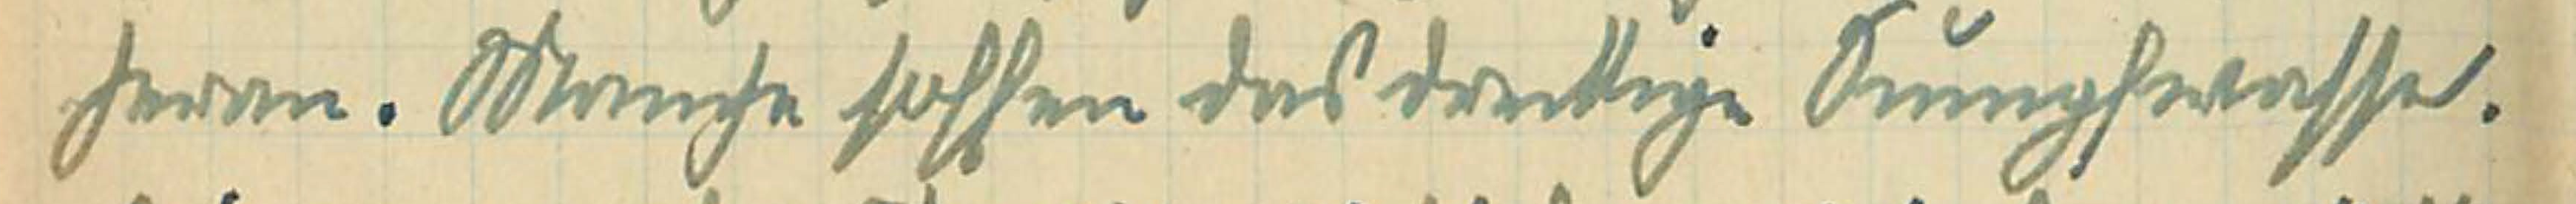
heran. Manche soffen das dreckige Sumpfwasser.
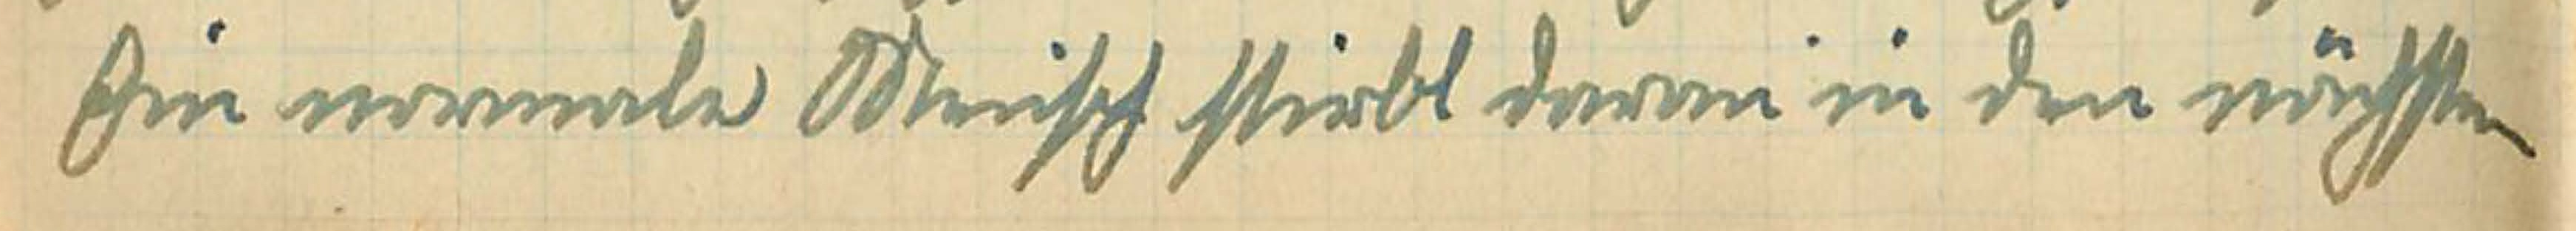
Ein normaler Mensch stirbt daran in den nächsten
